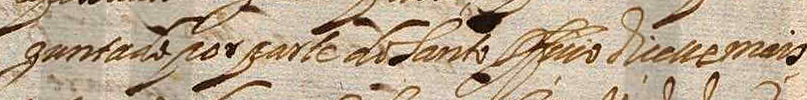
guntado por parte do Santo Officio dicesse mais
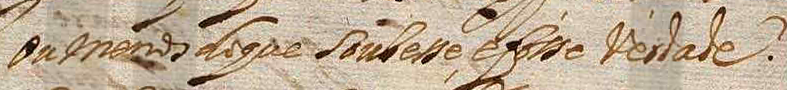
ou menos do que soubesse e fosse verdade.
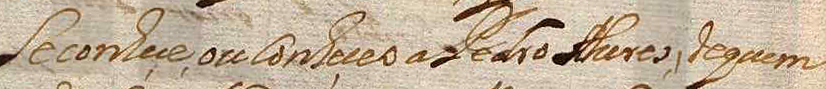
se conheçe, ou conheceo a Pedro Alures, de quem
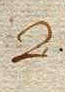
2.
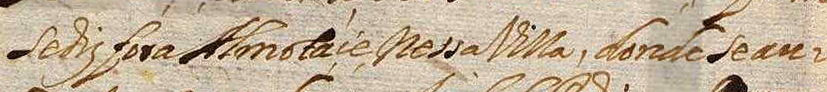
se diz fora Almotaçe, nessa Villa, donde se au
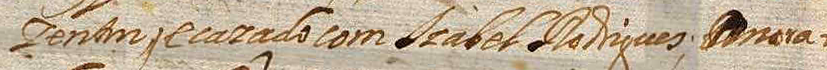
zentou, e cazado com Izabel Rodrigues, mora
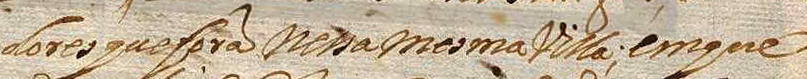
dores que foraõ nessa mesma Villa; em que
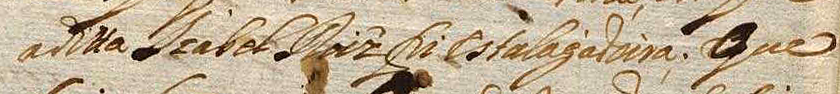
a ditta Izabel Roiz̄ foi estalagadeira; Que
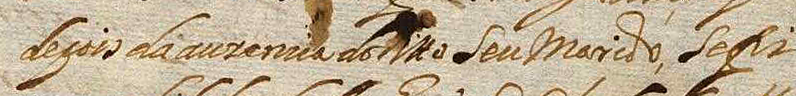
depois da auzenca do ditto seu marido, se foi
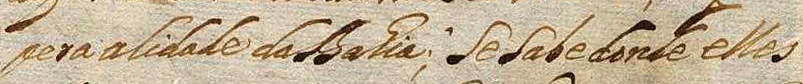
pera a Cidade da Bahia; se sabe donde elles
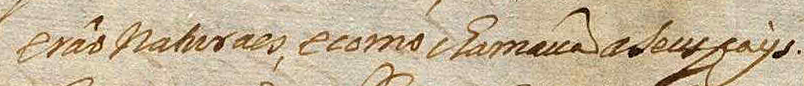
erão naturaes, e como chamauaõ a seus pays?
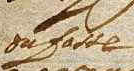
ou fosse
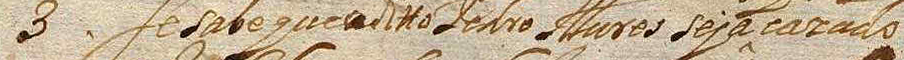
3. Se sabe que o ditto Pedro Alures seja cazado
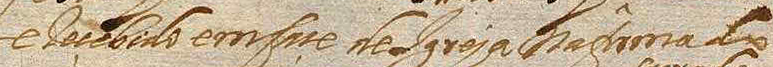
e Reçebido em façe de Igreja na forma do
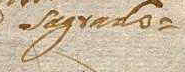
sagrado
